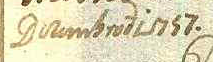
Dezembro d̄ i757.
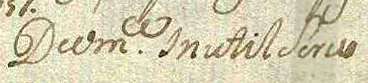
De V m.ce Inutil Seruo
